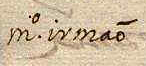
m.o irmaõ
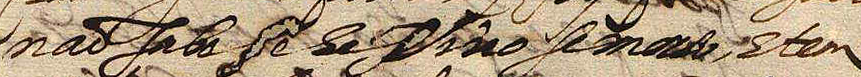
naõ sabe se he Viuo se morto, E tem
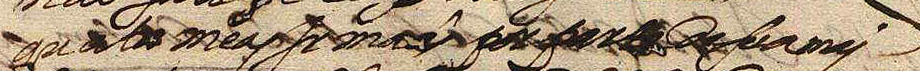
quatro meas Jrmaās por parte de sua maj
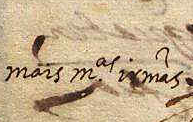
mais m.as irmãs
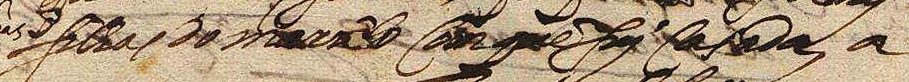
filhas do marido Com que foj Casada, a
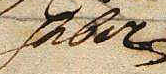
saber
